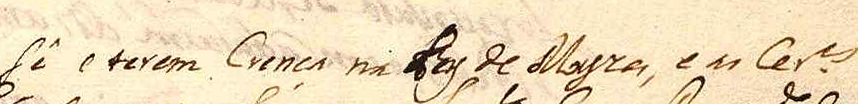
fé, e terem Crença na Ley de Moyzes, e as Cer.as
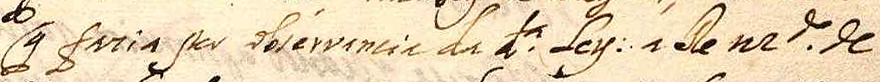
q̄ fazia por observencia da d̄a. Ley: a Re uzd.o de
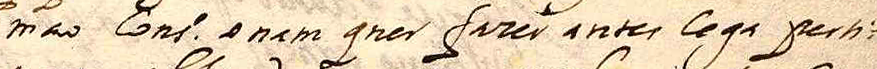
mao Cons.o o nam quer fazer antes cega perti
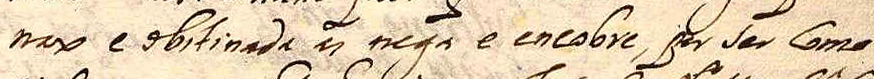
nax e obstinada as nega e encobre, por ser Como
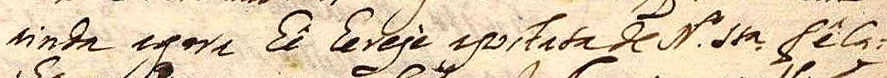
ainda agora hê hereje apostata de N.a sta. fê Ca
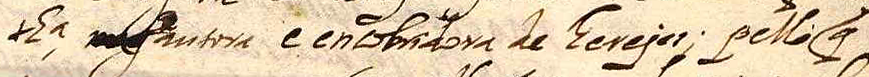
tha, _fautora e encobridora de herejes; pello q̄
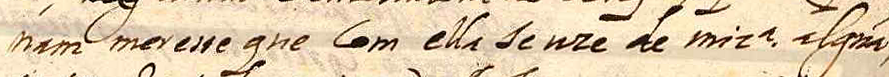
nam meresse que Com ella se uze de miza. alguā,
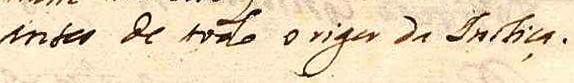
antes de todo o rigor da Iustiça.
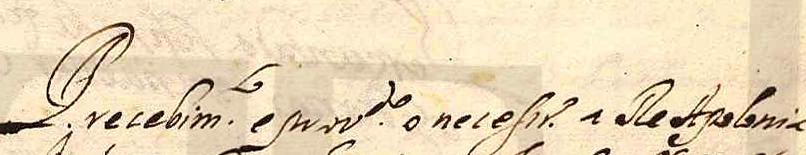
P. recebim.to e prov.do o necessr.o a Re Apolonia
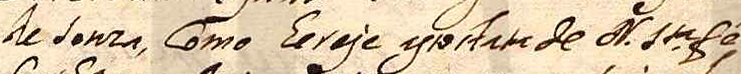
de souza, Como hereje apostata de N. s.ta fê
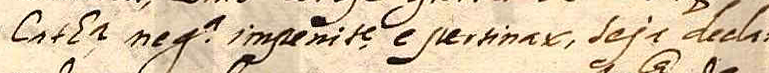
Catha, neg.a impenite, e pertinax, seja decla
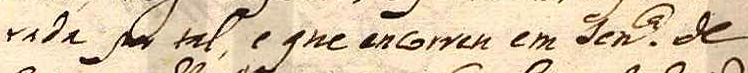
rada por tal, e que encorreu em sen.ça de
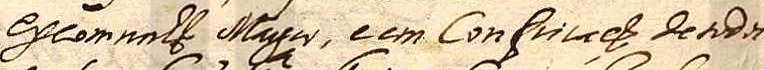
excomunhão Mayor, e em Confiscação de todos
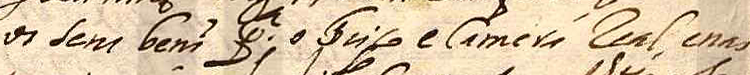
os sens bens̄ p.a o Fisco e Camera Real, e nas
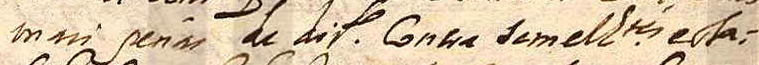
mais penas de dir.to Contra semelh.tes esta
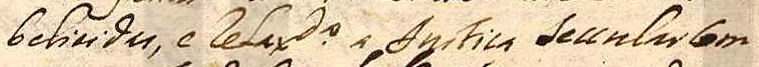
belicidas, e ReLaxd.o a Iustiça seccular com
